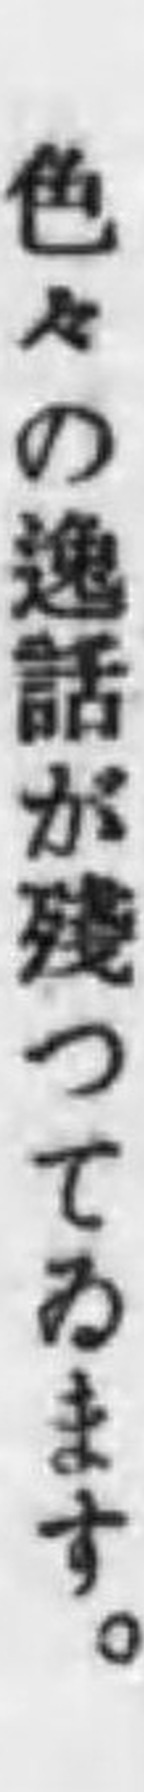色々の逸話が残つてゐます。
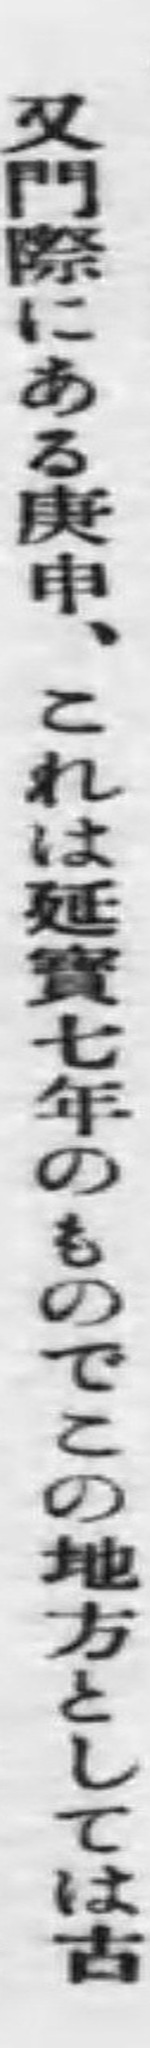又門際にある庚申、これは延宝七年のものでこの地方としては古
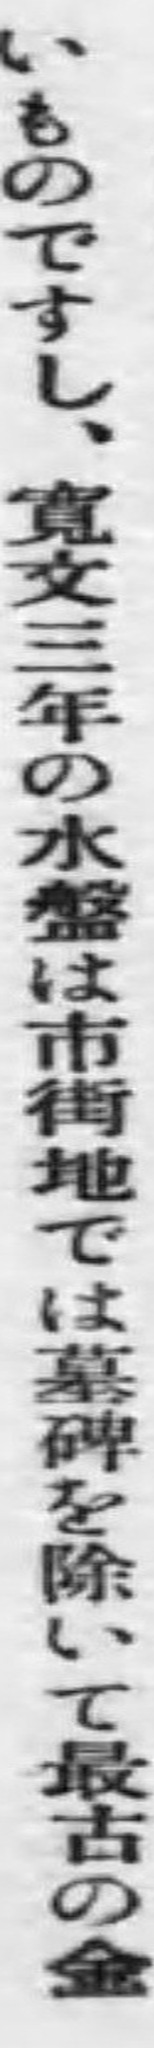いものですし、寛文三年の水盤は市街地では墓碑を除いて最古の金
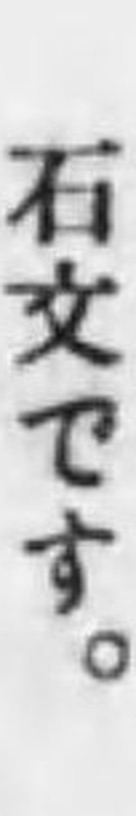石文です。
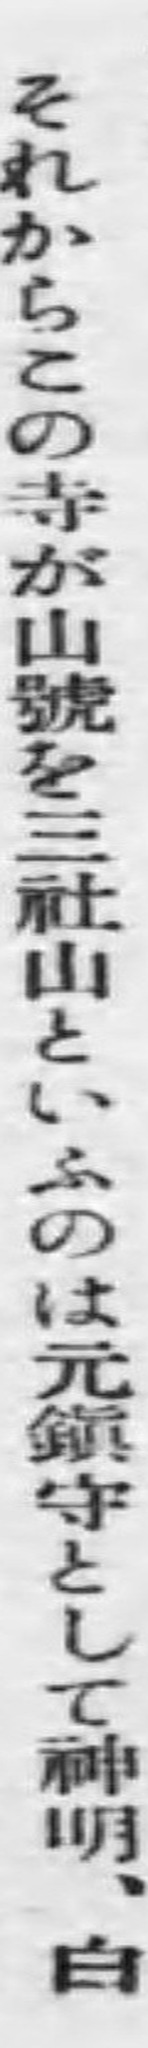それからこの寺が山号を三社山といふのは元鎮守として神明、白
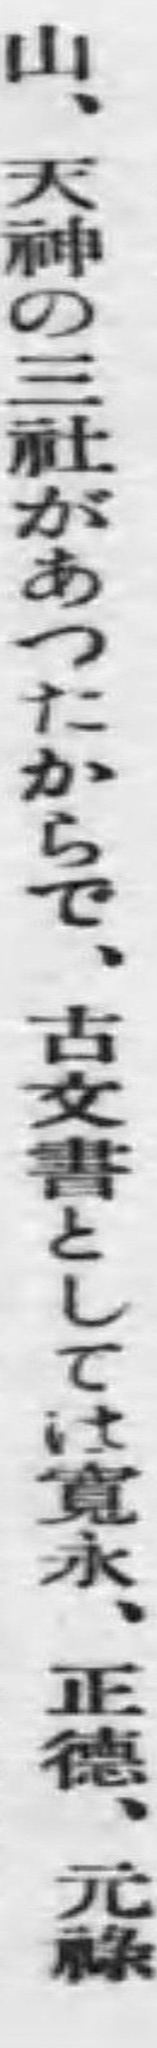山、天神の三社があつたからで、古文書としては寛永、正徳、元禄
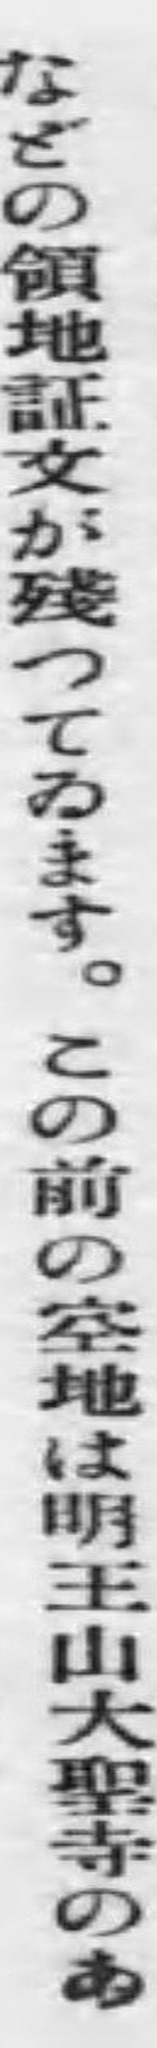などの領地証文が残つてゐます。この前の空地は明王山大聖寺のあ
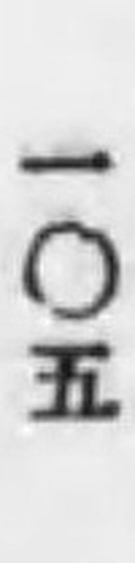一〇五

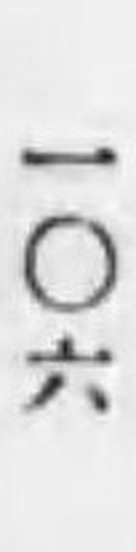一〇六
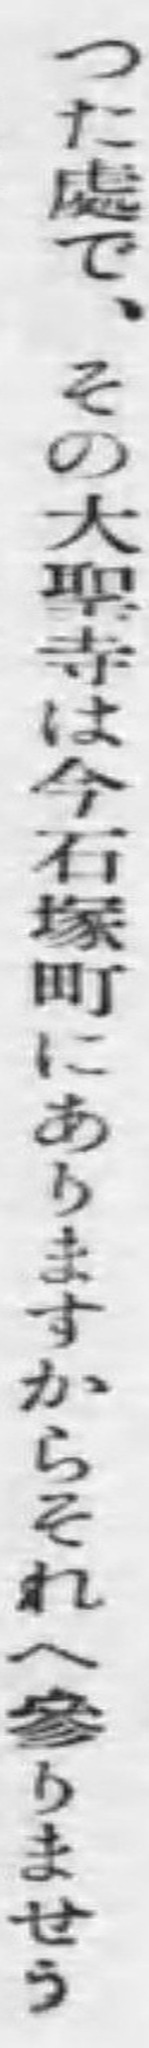つた処で、その大聖寺は今石塚町にありますからそれへ参りませう
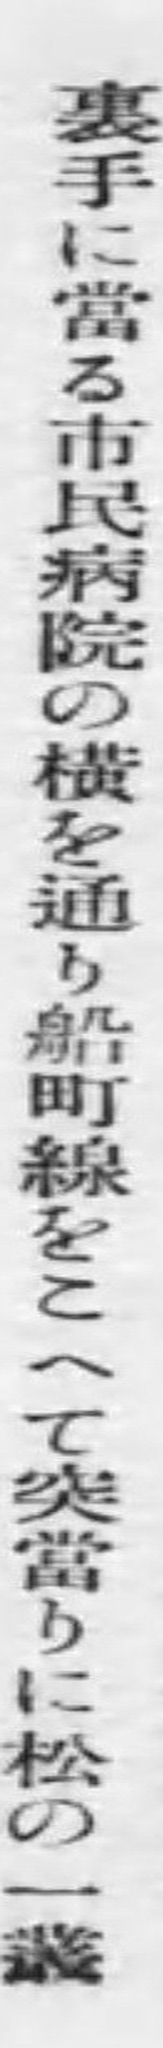裏手に当る市民病院の横を通り船町線をこへて突当りに松の一叢
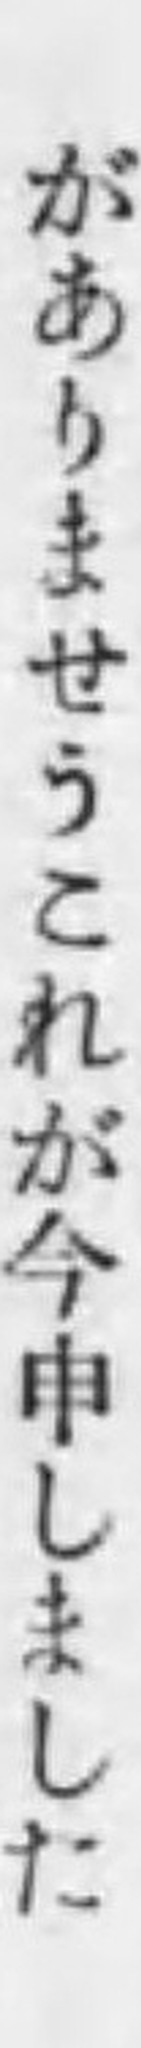がありませうこれが今申しました
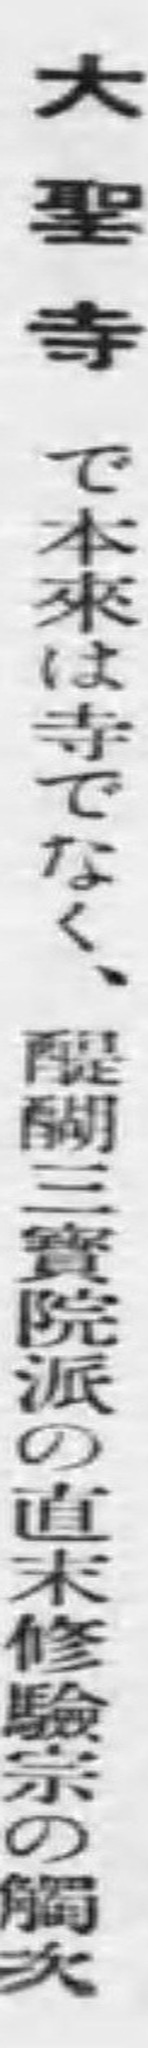大聖寺で本来は寺でなく、醍醐三宝院派の直末修験宗の触次
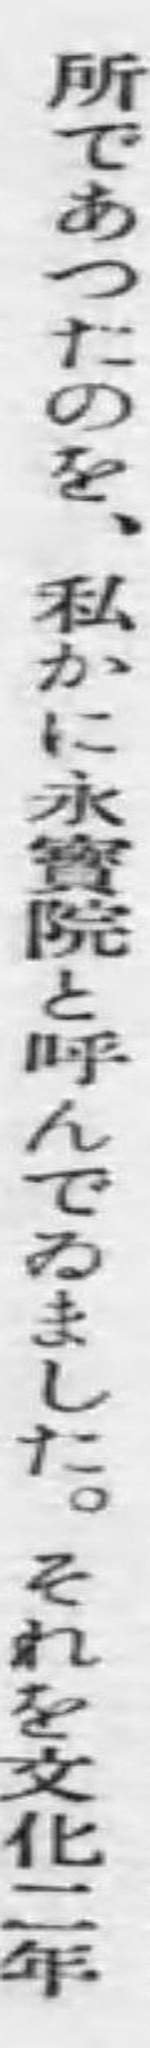所であつたのを、私かに永宝院と呼んでゐました。それを文化二年
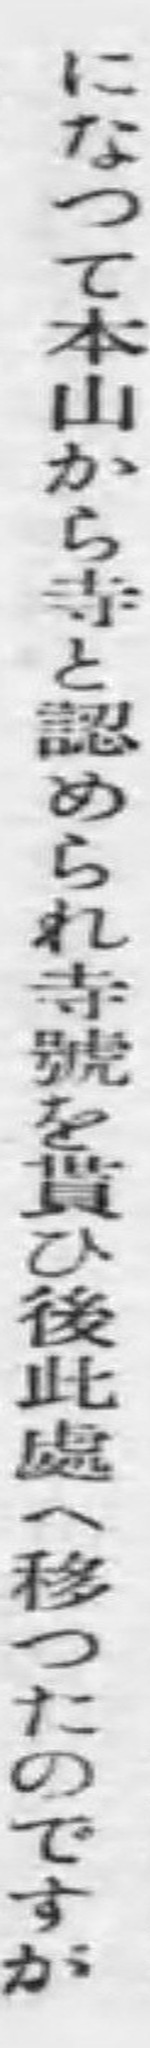になつて本山から寺と認められ寺号を貰ひ後此処へ移つたのですが
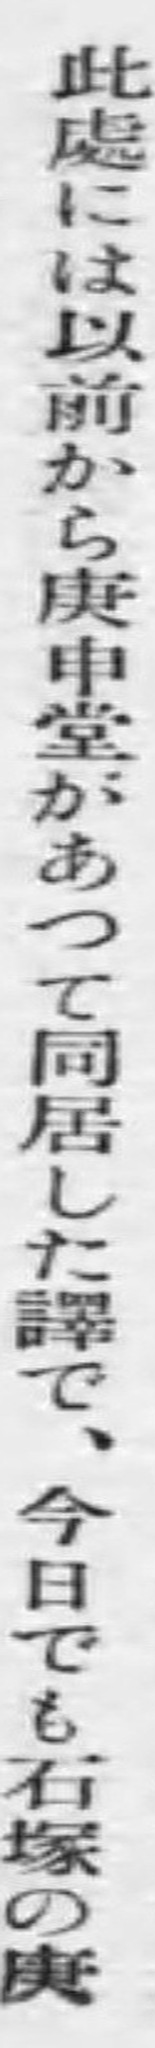此処には以前から庚申堂があつて同居した訳で、今日でも石塚の庚
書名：東三河道中記 : 豊橋市及其附近案内
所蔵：国立国会図書館 National Diet Library, JAPAN
